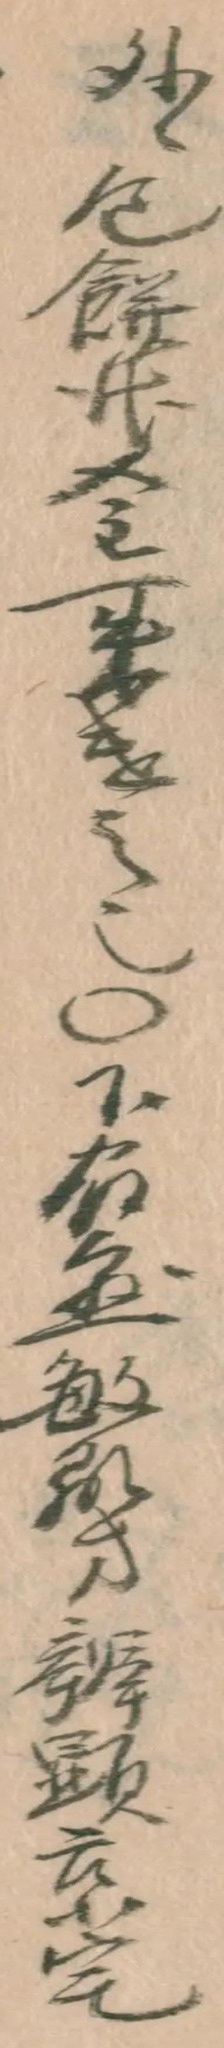外へ包餅代金一朱遣之也〇下有盃敏顕方辨顕京宅
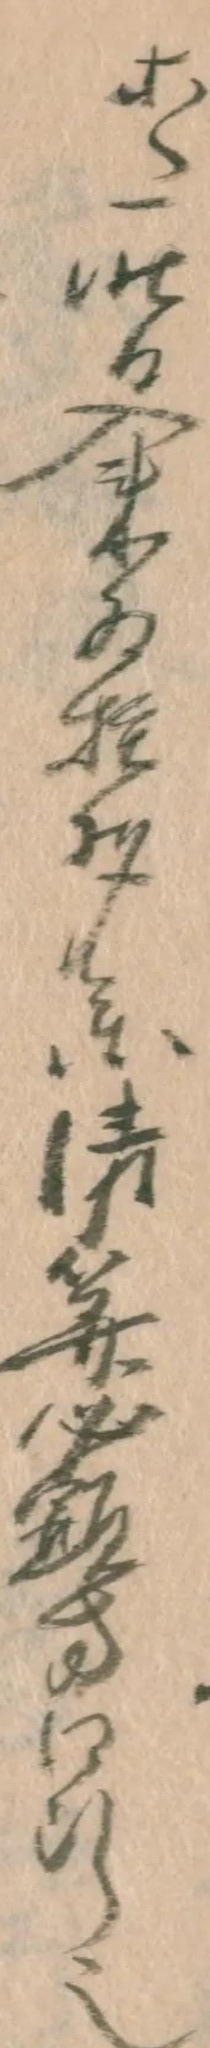等へ一昨日入来為挨拶清算必顕方同断也
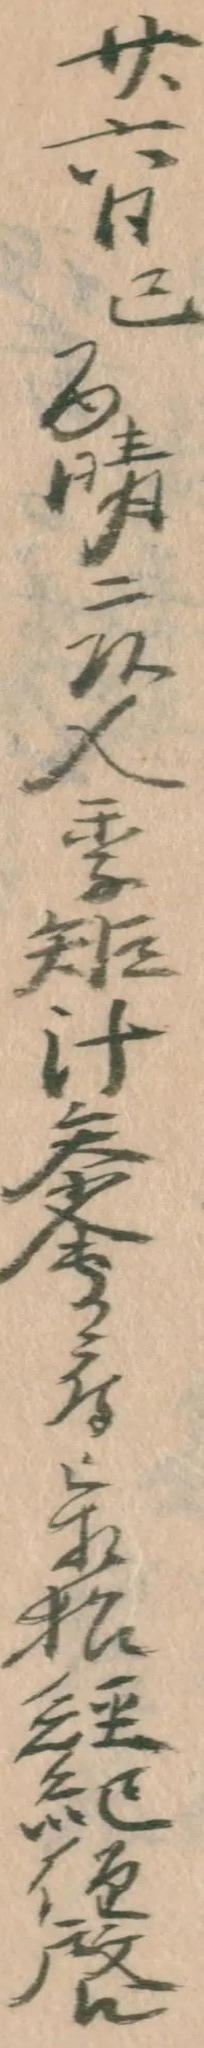廿六日己酉晴二頭人季矩汁参會ニ付被相招経紀経啓
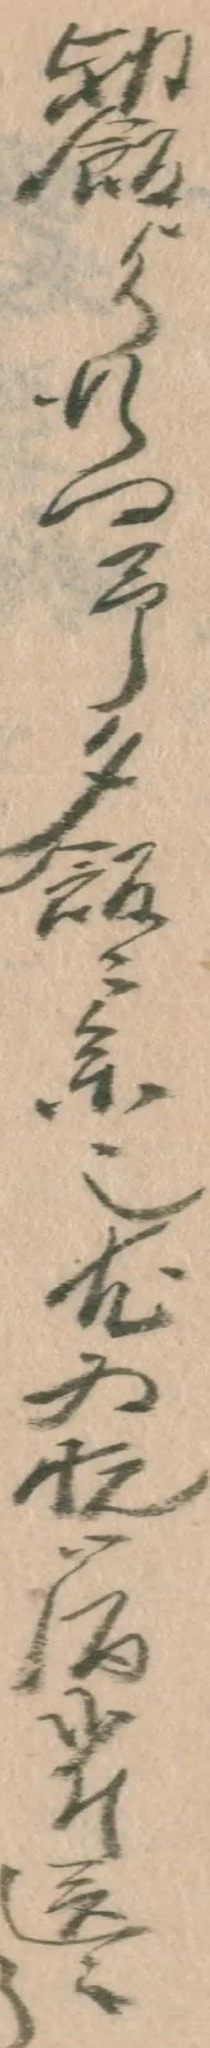朝飯より行向予夕飯二参也尤為祝御酒弐升送之了
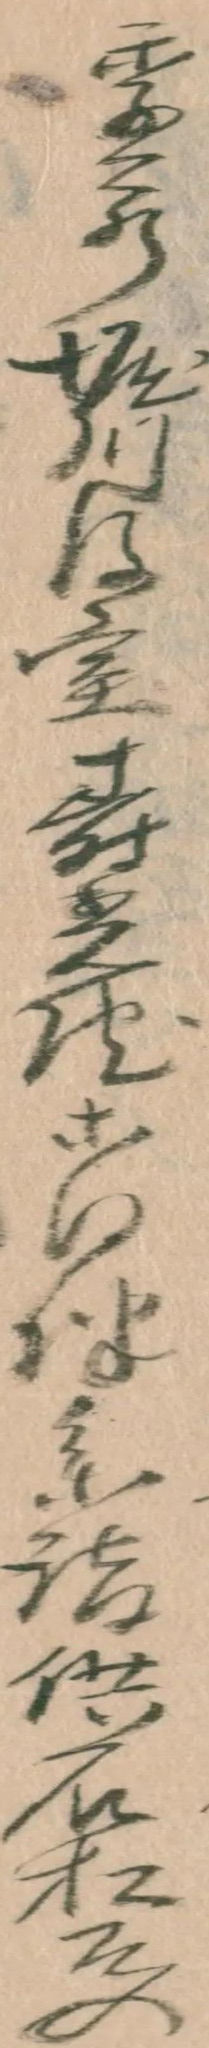季前堀川後室寿光院等同伴参詣供石松その
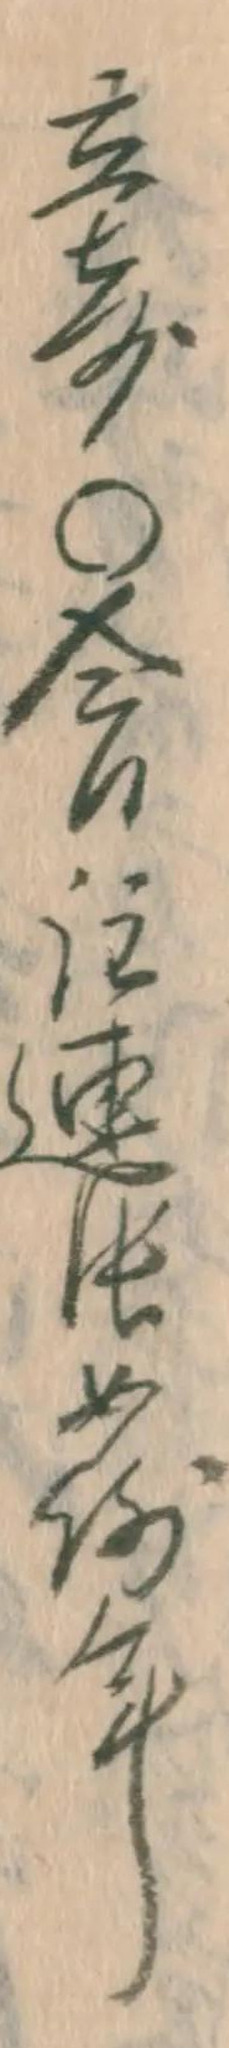立寄〇今日注連帳如例年
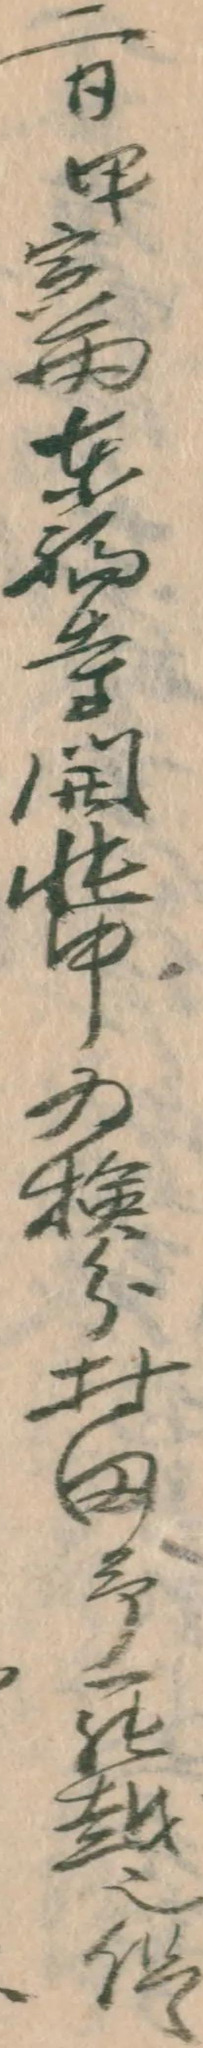二日甲寅雨東福寺開帳中為検分村田予罷越也但し
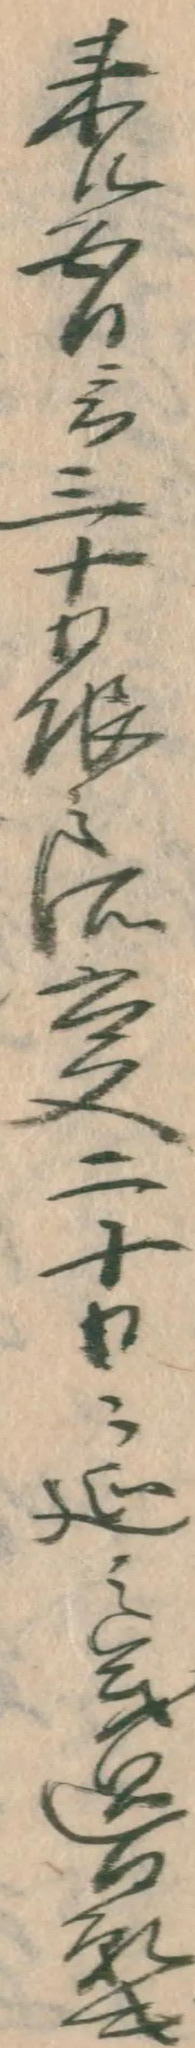来ル五日ニ而三十日限之所尚又二十日ニ延之義過日願出
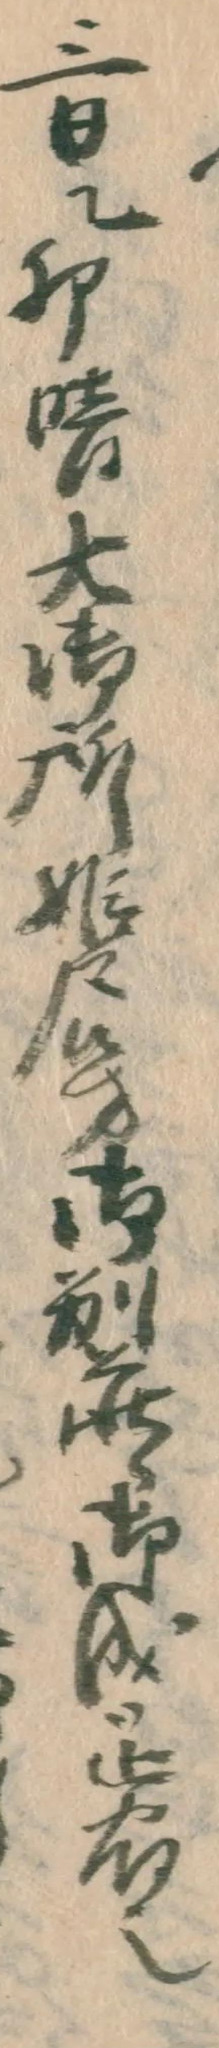三日乙卯晴大御所姫君御方御別蔵御成御止宿之
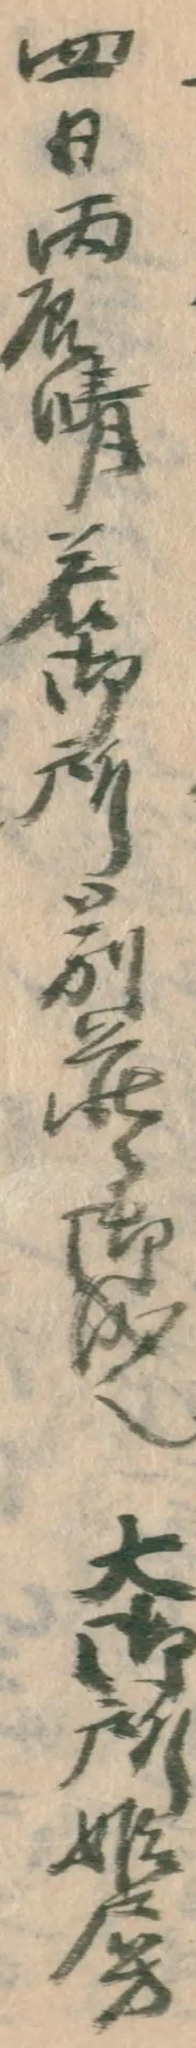四日丙辰晴若御所御別蔵へ御成也大御所姫君方
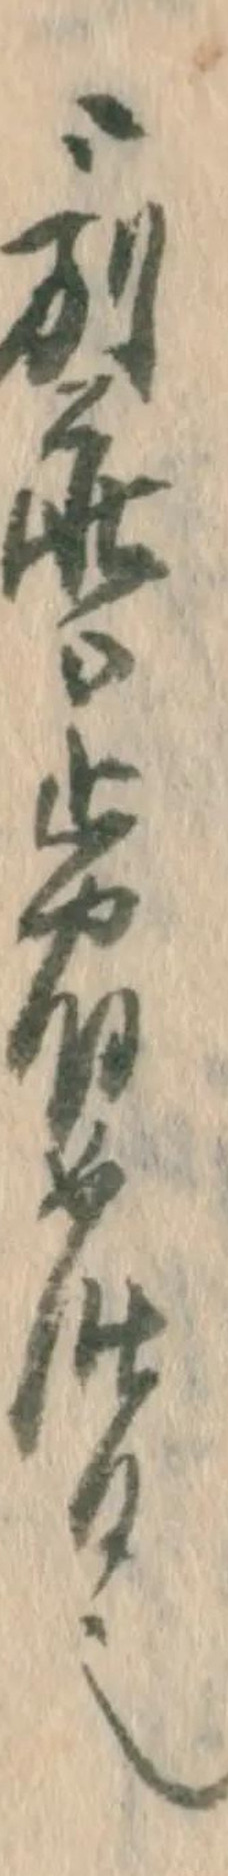御別蔵御止宿如昨日也
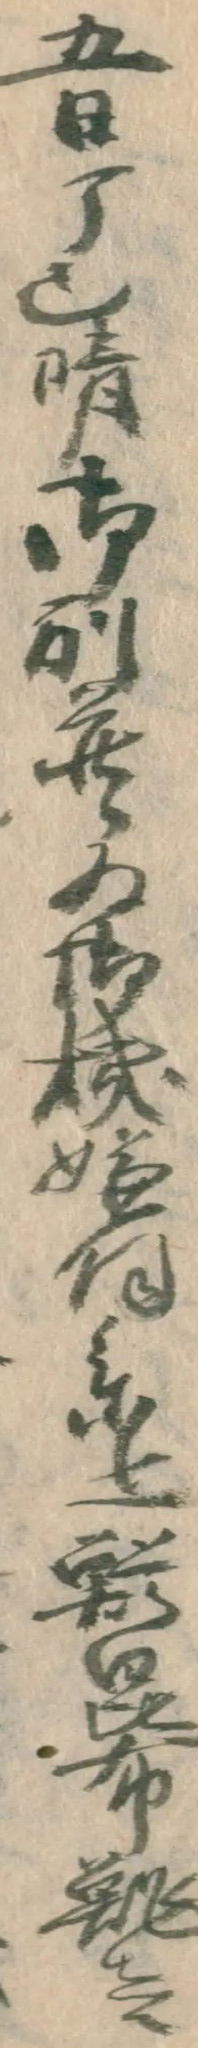五日丁巳晴御別蔵へ為御機嫌伺参上鱒白比布難壱
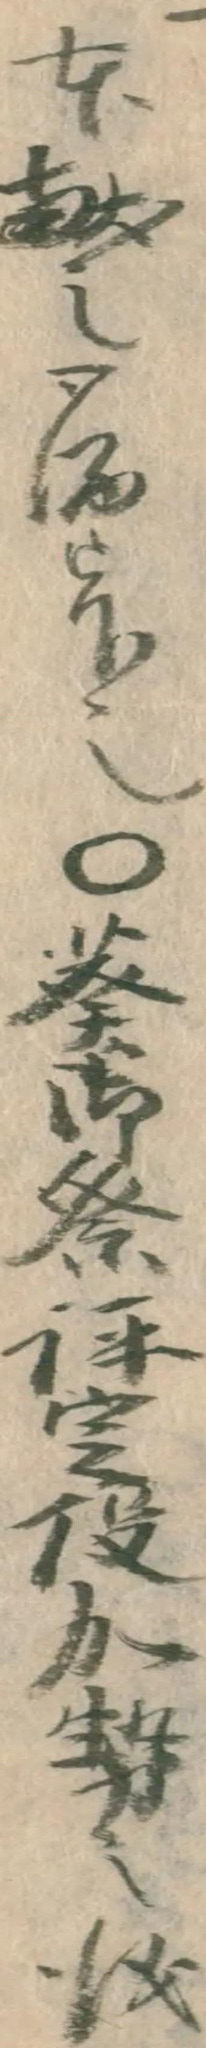本献之御酒被下也○葵御祭評定役加勢之儀
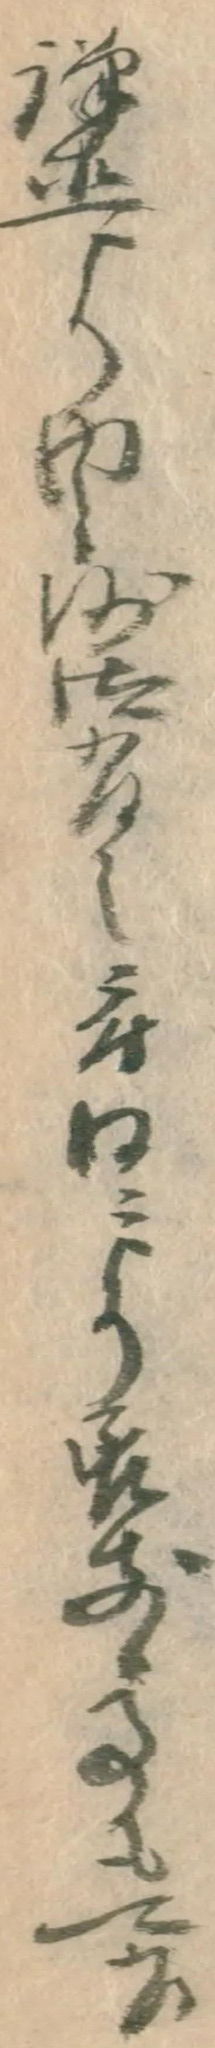謹直より内々沙汰有之ニ付日ニより差支候事も可有

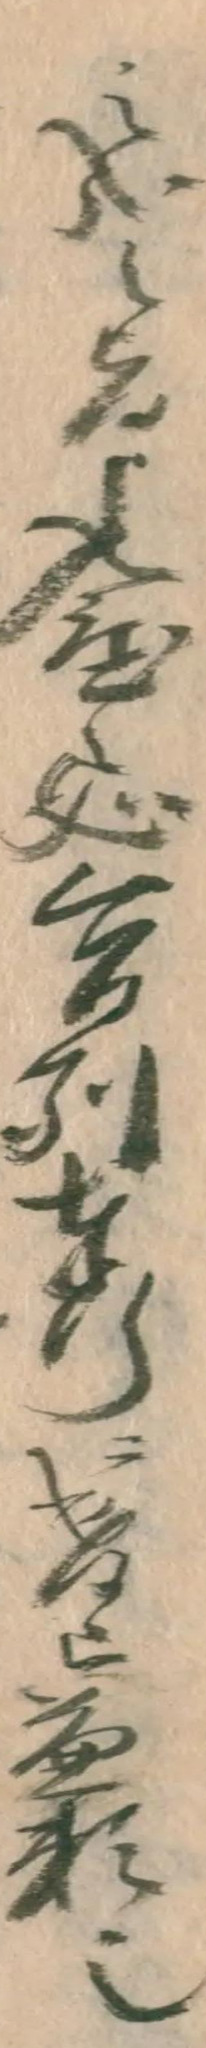之分之旨申入置之処今日列奉行に出候被兼頼也
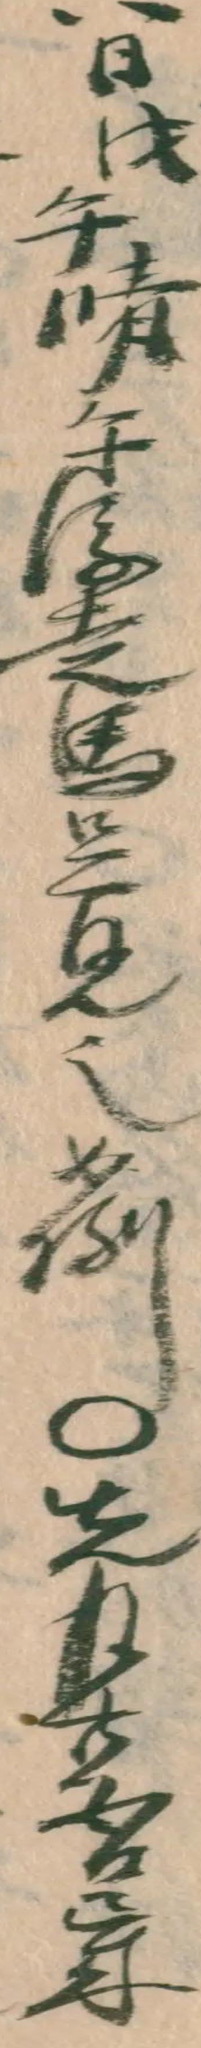六日戊午晴午後走馬足見也如例○先月廿五日已来
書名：賀茂社記録. 第67冊
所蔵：国立国会図書館 National Diet Library, JAPAN
